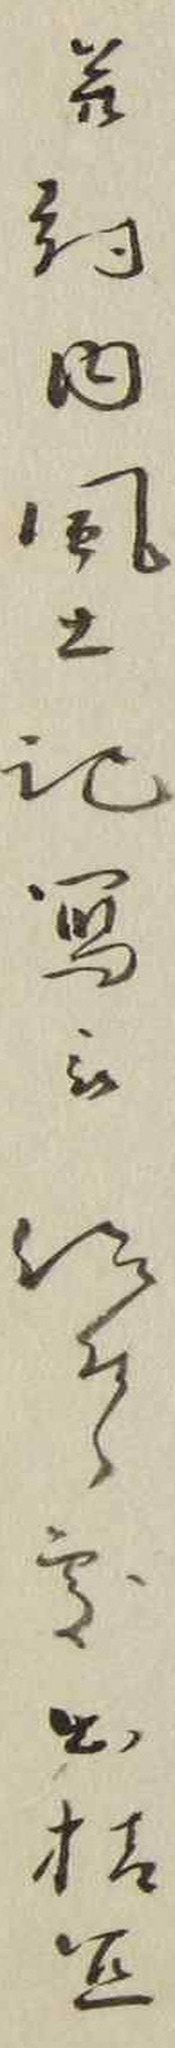并封内風土記写被仰付候処出精宜

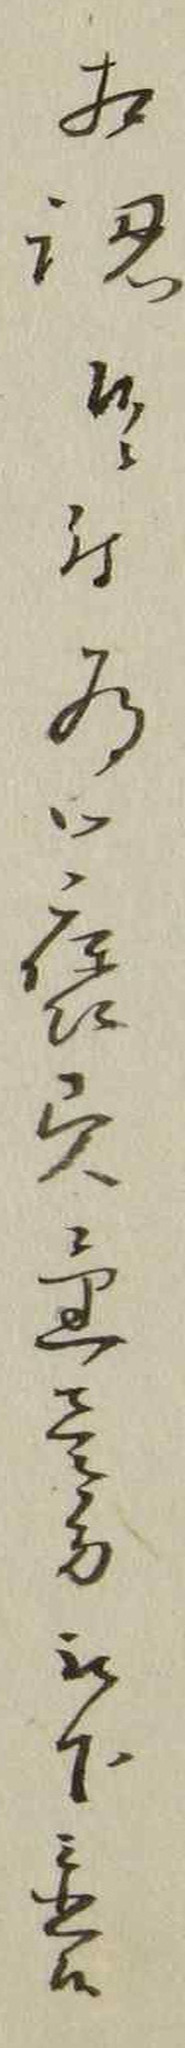相認候ニ付為御褒美金壱分被下置候
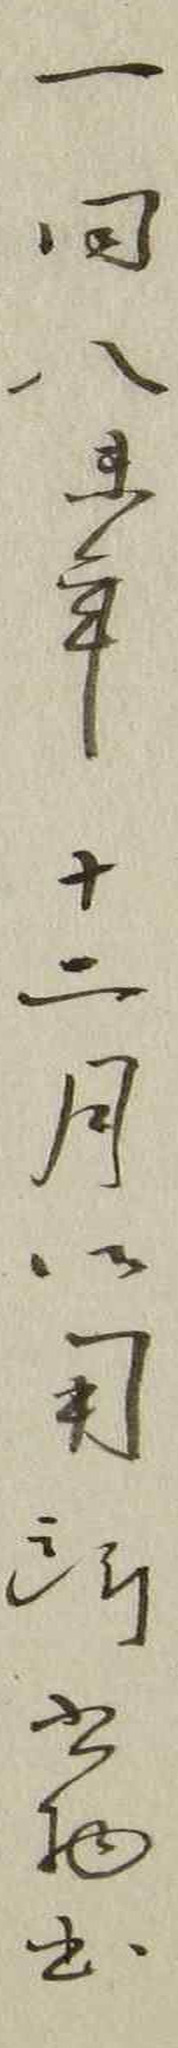一同八未年十二月御用所書物出
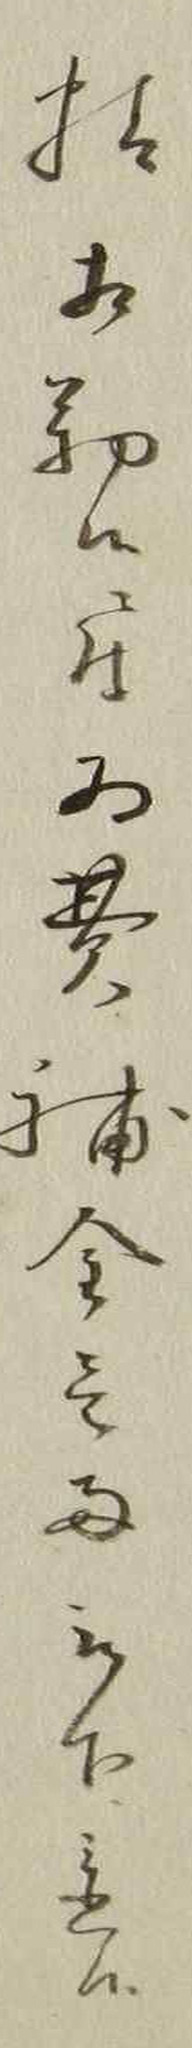精相勤候ニ付為費補金壱両被下置候
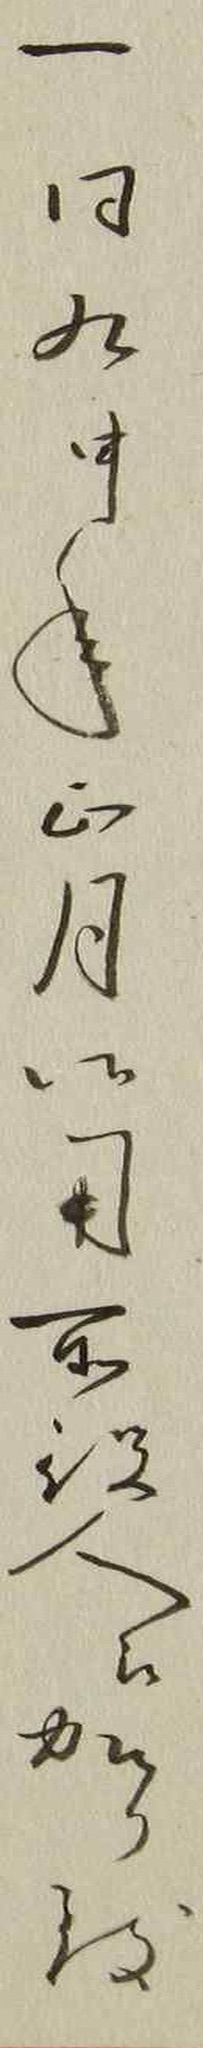一同九申年正月御用所役人江加り致
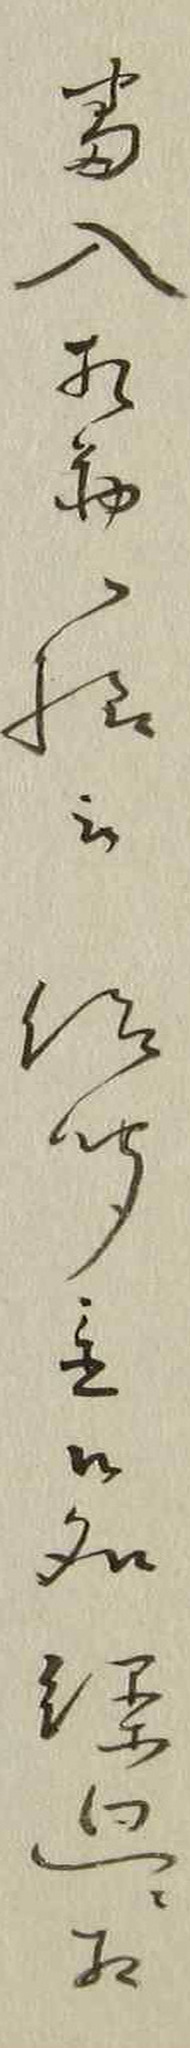番入相勤候様被仰聞置候処繰廻ニ相
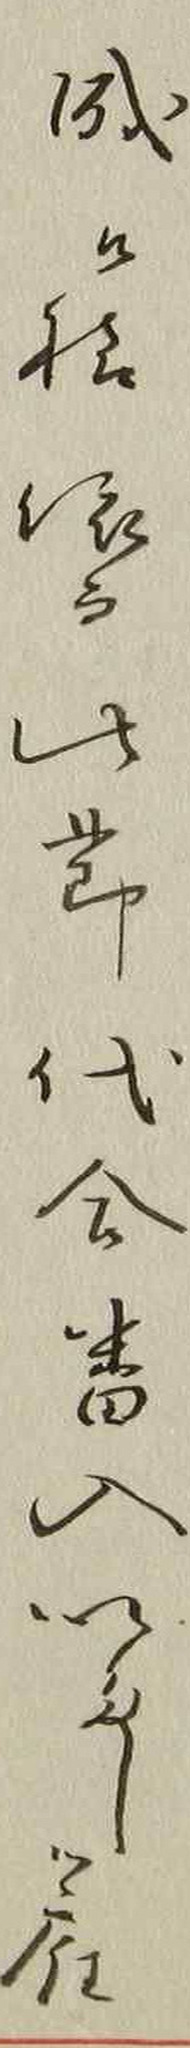成候様依而此節代合番入いたし御雇
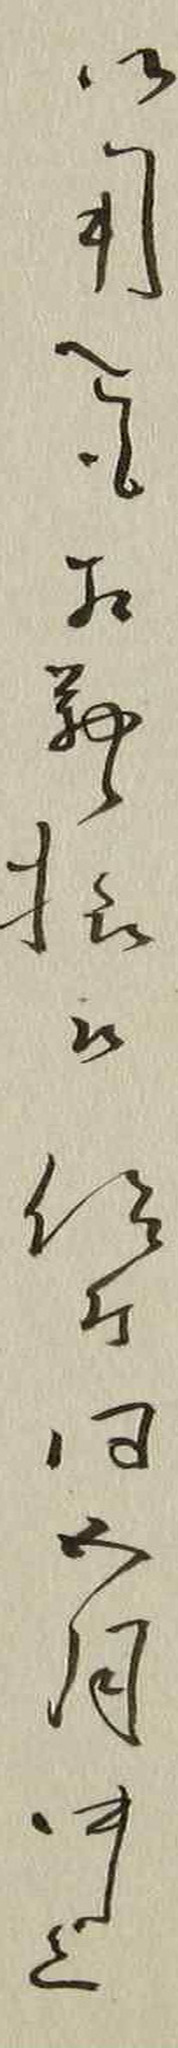御用をも相勤候様被仰付同五月中迄
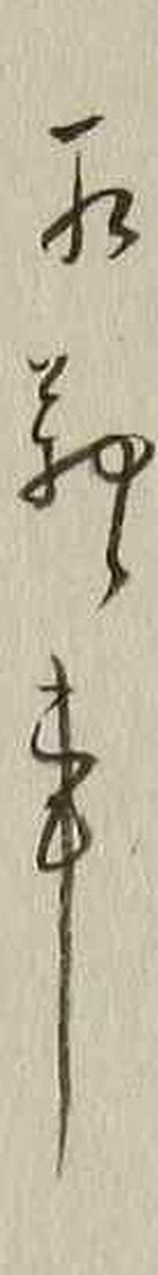相勤候事
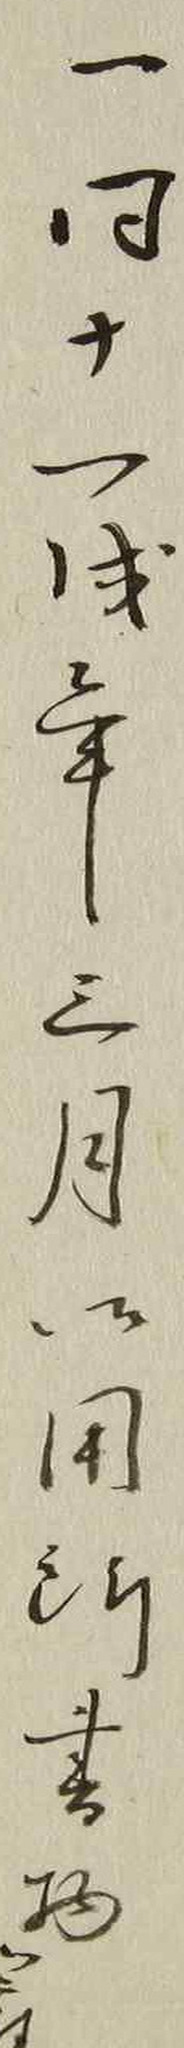一同十一戌年三月御用所書物雇
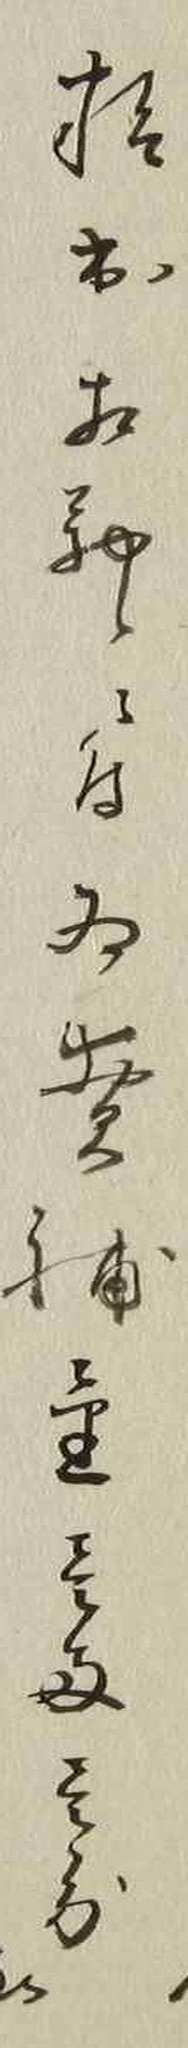精出相勤候ニ付為費補金壱両壱分被
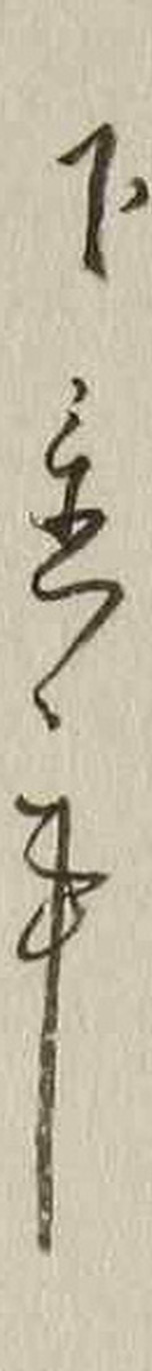下置候事
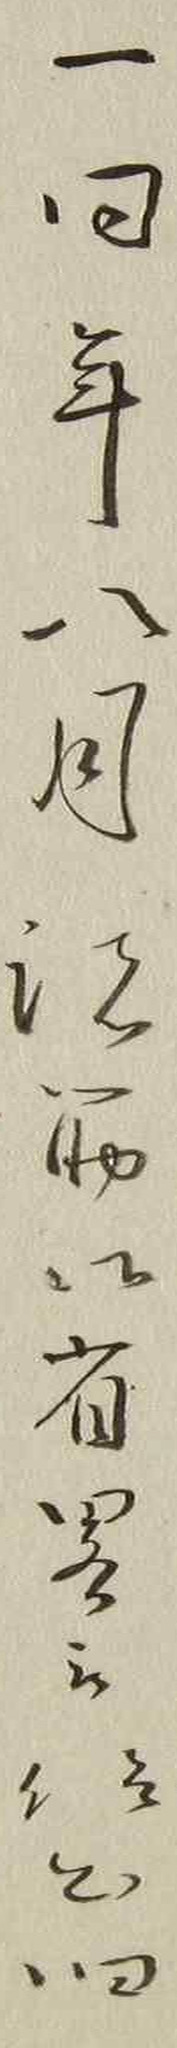一同年八月諸筋御省畧被仰出旧
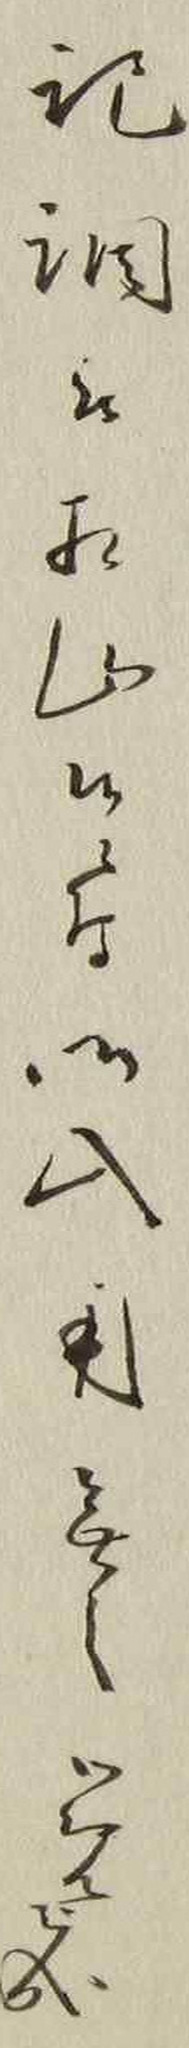記調被相止候ニ付御入用無之御免被成
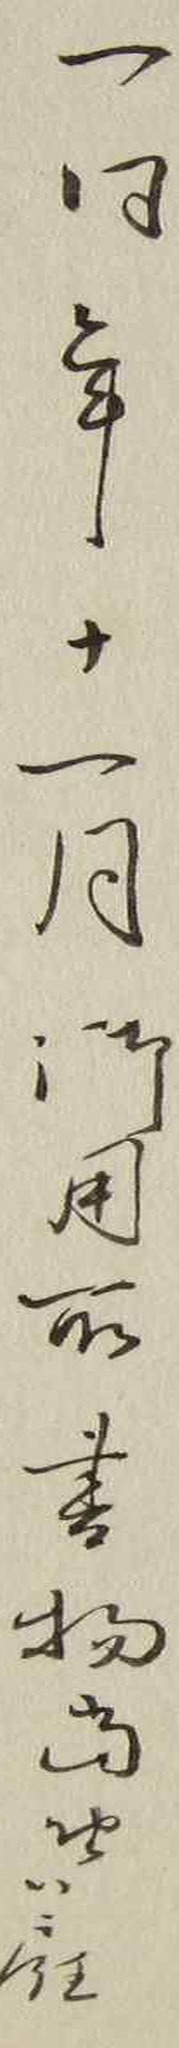一同年十一月御用所書物当座御雇
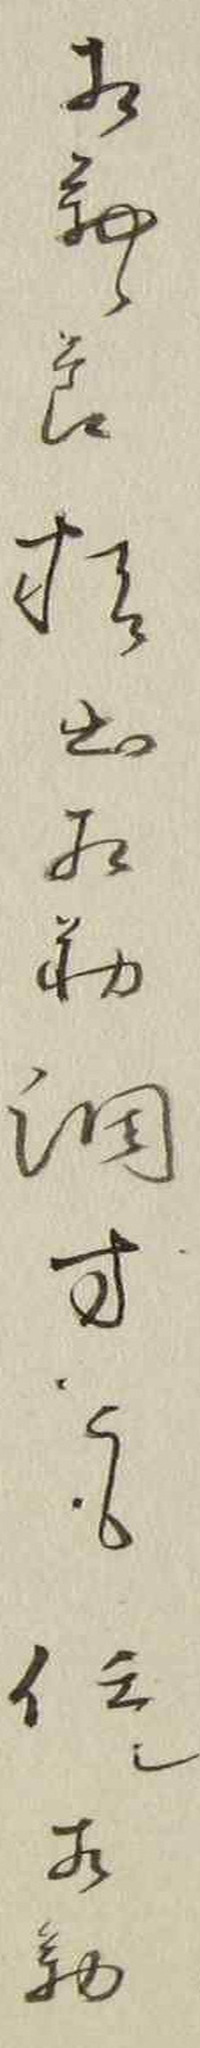相勤候節精出相勤調方とも任シ相勤
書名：諸士系譜　巻之8　い之部8
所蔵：会津若松市立会津図書館
